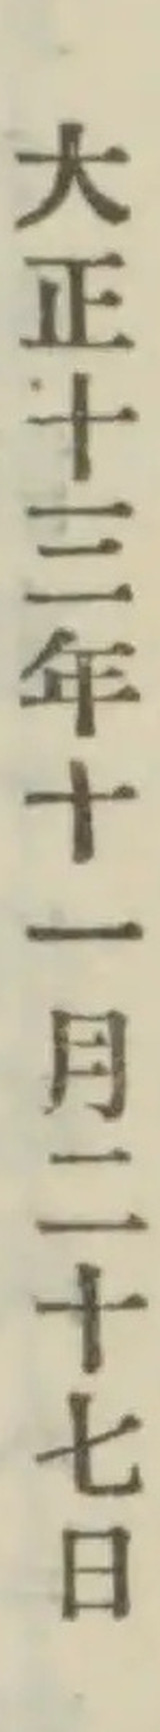大正十三年十一月二十七日
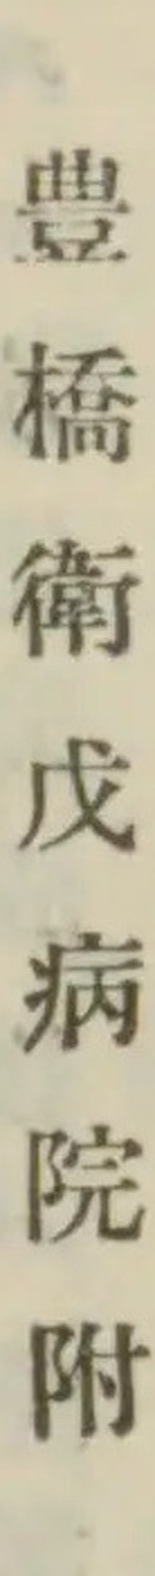豊橋衛生戊病院
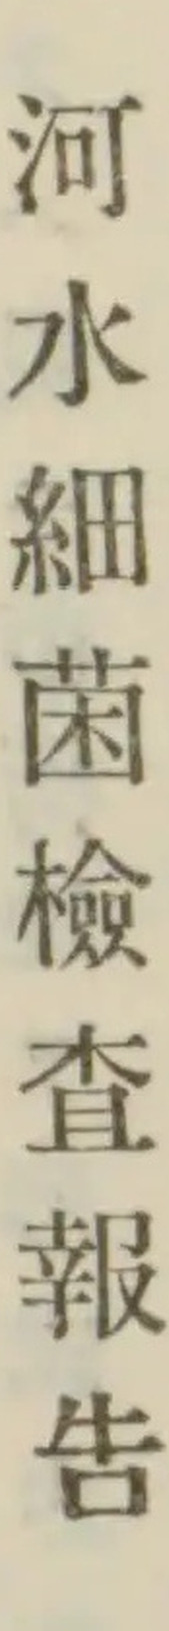河水細菌検査報告
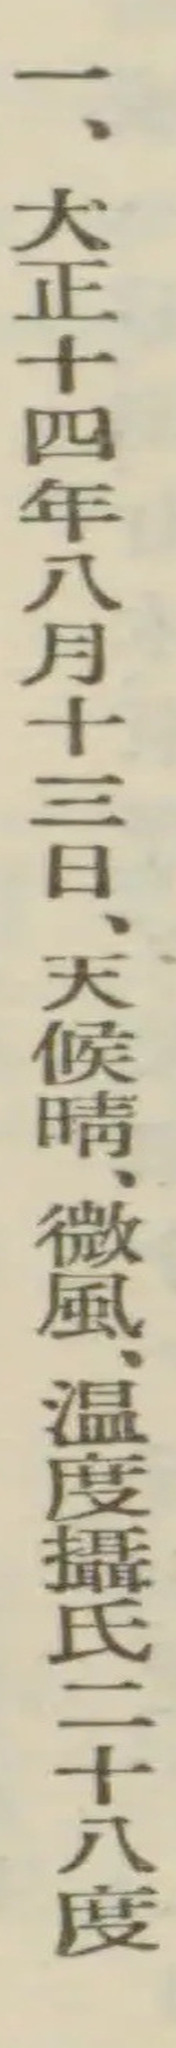一、大正十四年八月十三日、天候晴、微風、温度摂氏二十八度
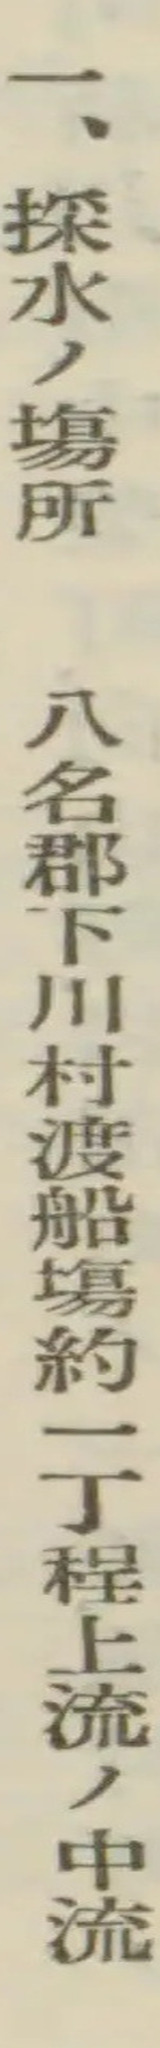一、採水の場所八名郡下川村渡船場約一丁程上流の中流
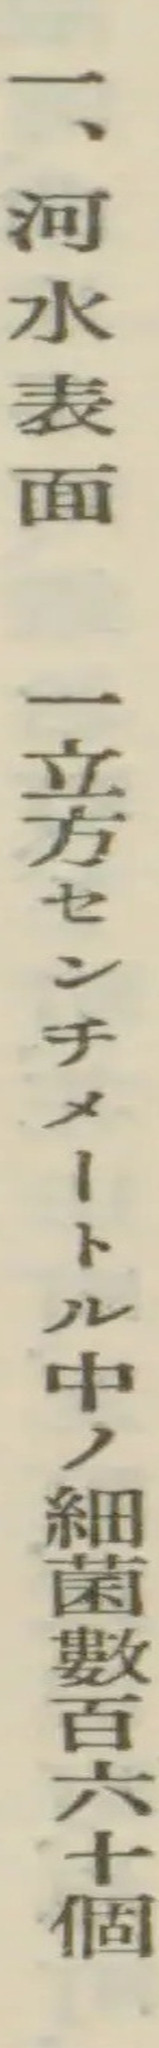一、河水表面一立方センチメートル中の細菌数百六十個
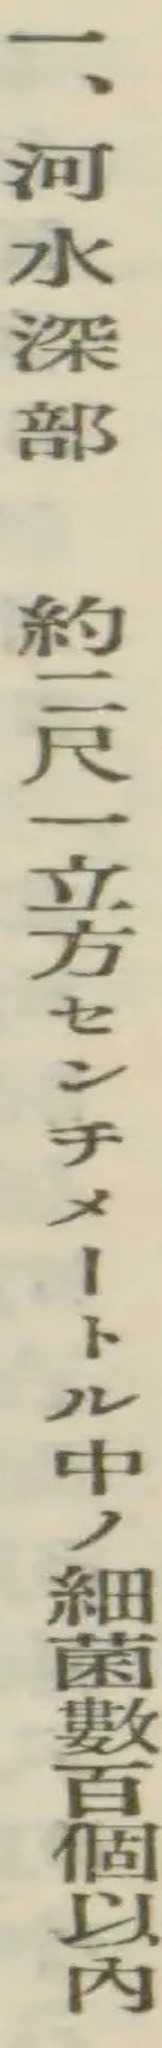一、河水深部約二尺一立方センチメートル中の細菌数百個以内
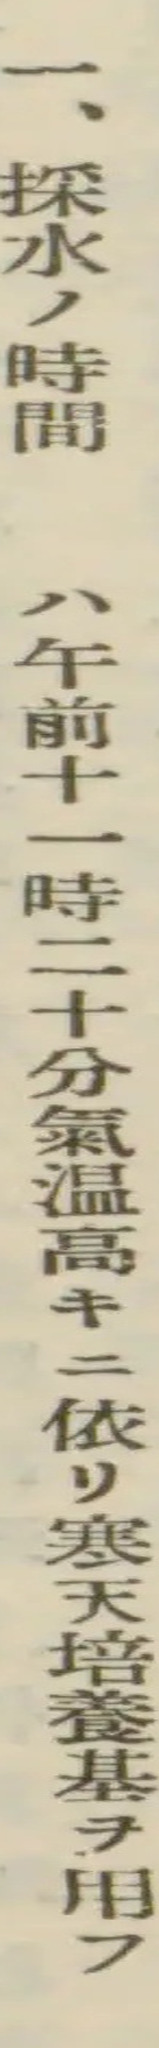一、採水の時間ハ午前十一時二十分気温高きに依り寒天培養基を用ふ
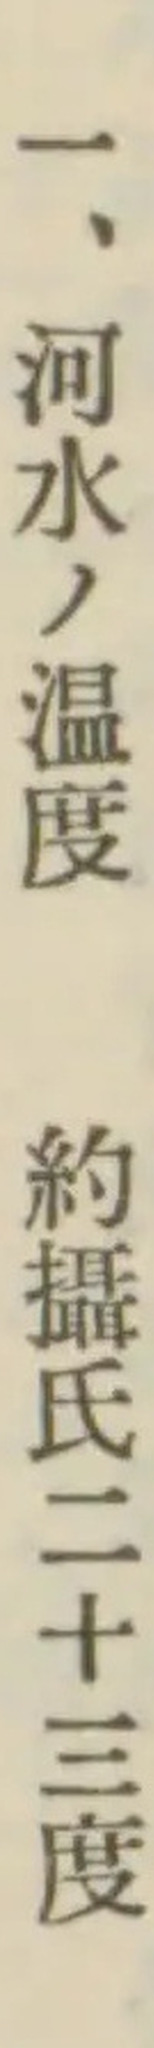一、河水の温度約摂氏二十三度
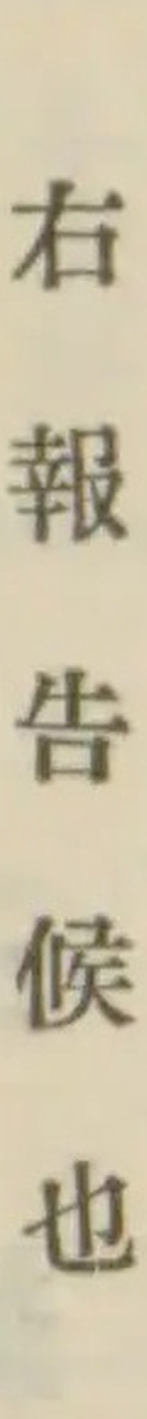右報告候也
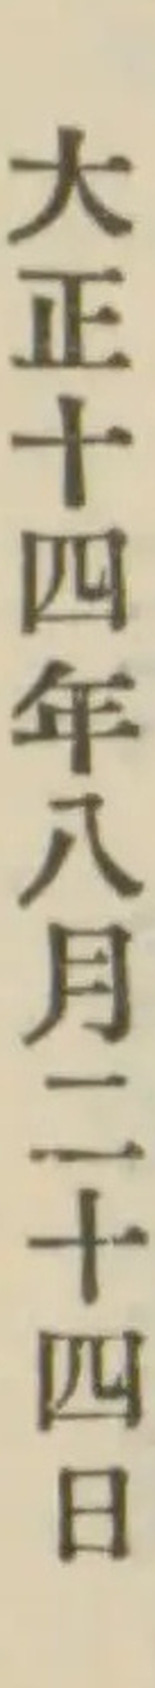大正十四年八月二十四日

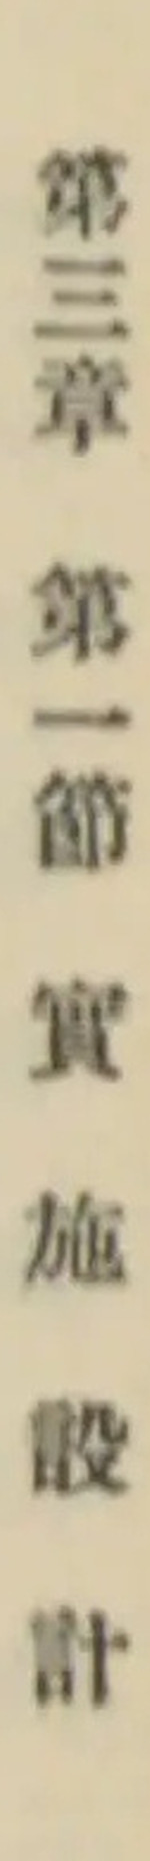第三章第一節実施設計
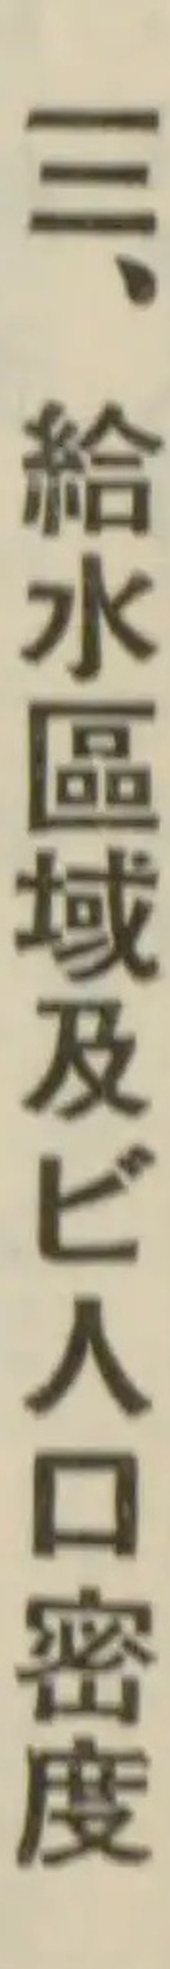三、旧給区域及び人口密度
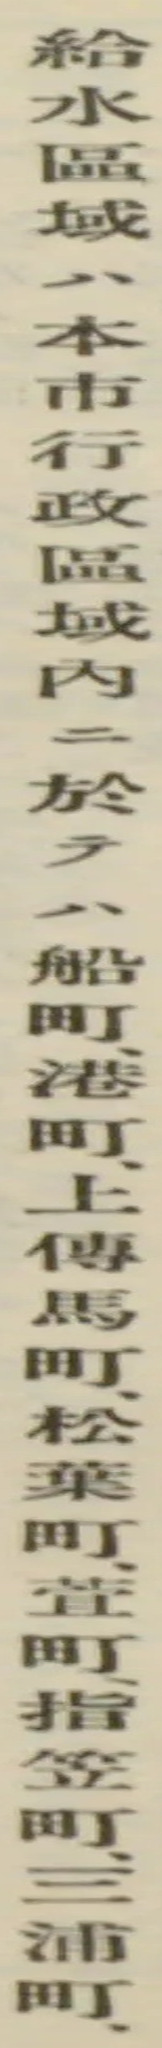給水区域は本市行政区域内に於ては船町、上伝馬丁、松葉町、萱町、指笠町、三浦町、
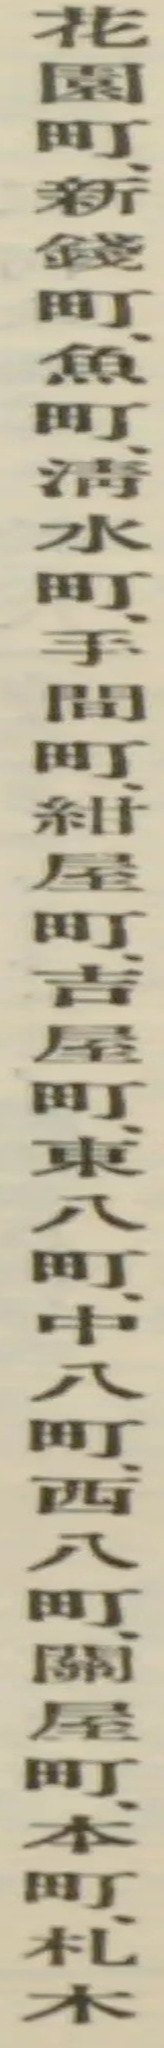花園町、新錢町、魚町、清水町、手間町、紺屋町、吉屋町、東八町、中八町、西八町、關谷町、札木
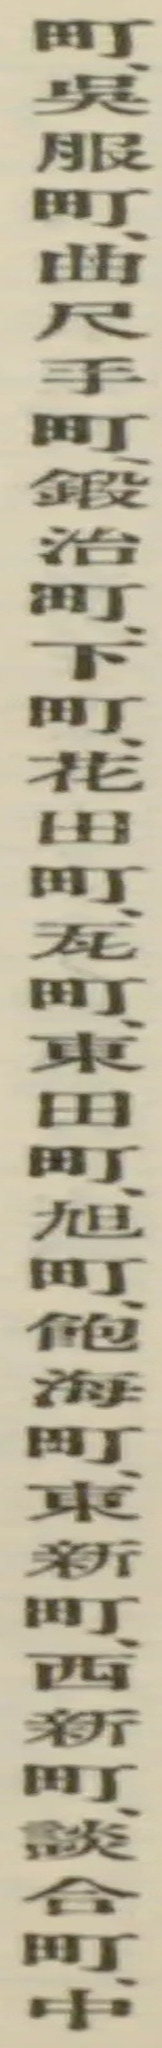町、呉服町、曲尺手町、鍛冶町、下町、花田町、瓦町、東田町、旭町、海町、東新町、西新町、談合町、中
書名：豊橋市水道誌
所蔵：国立国会図書館 National Diet Library, JAPAN
